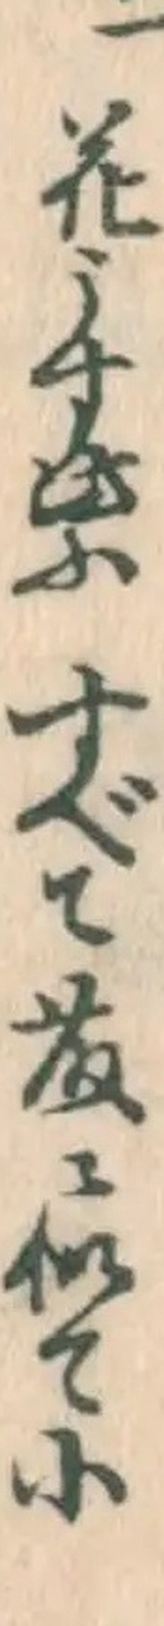花うす紫すべて藤に似て小
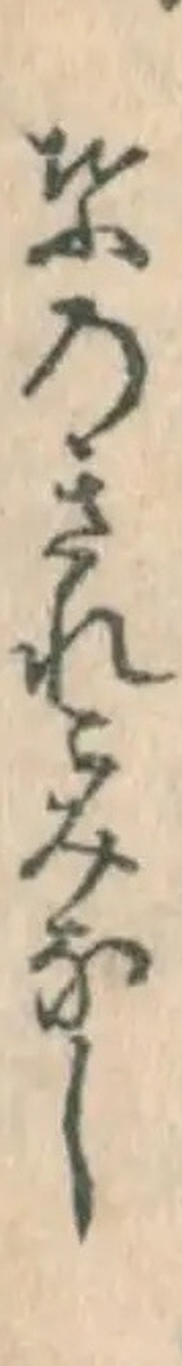葉のきれこみなし

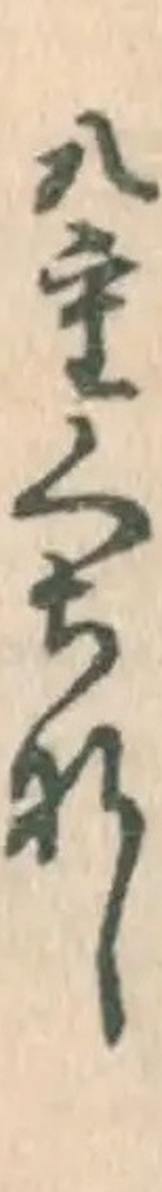八重くちなし
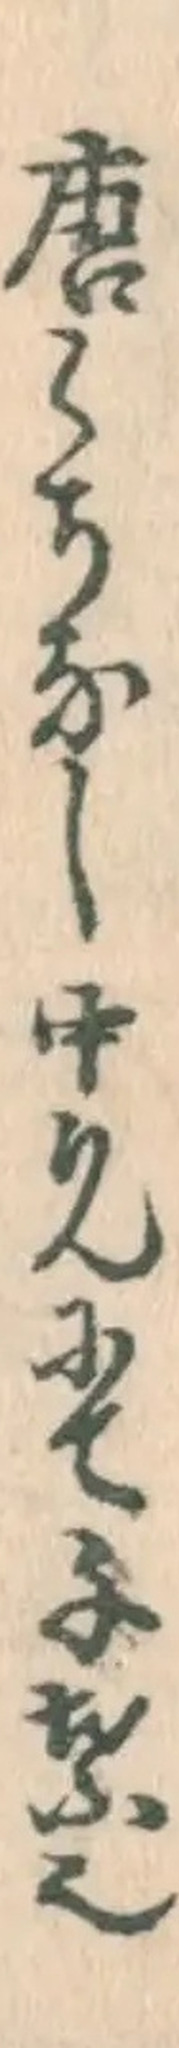唐くちなし中りん少て葉也
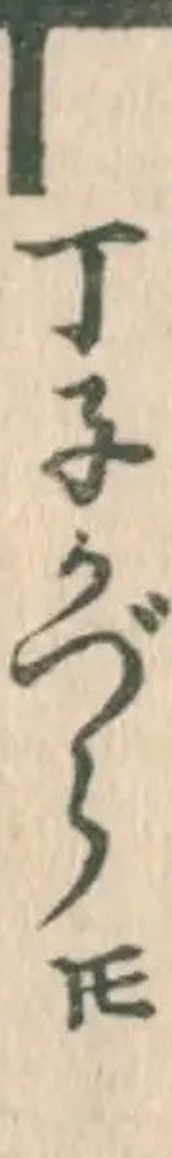丁子かづら共
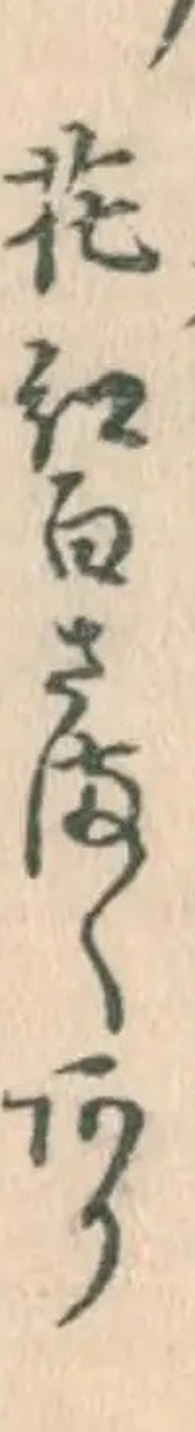花紅白さまさまあり
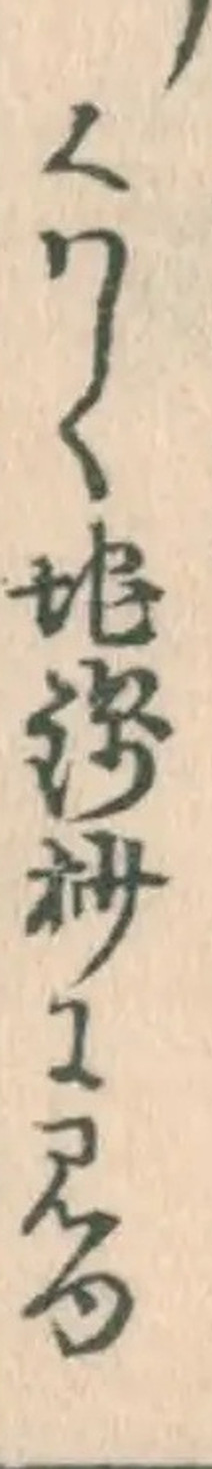くハしく地錦抄に見ゆ
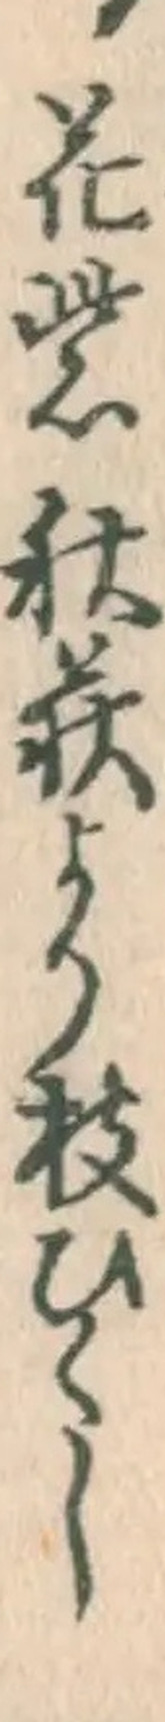花紫秋萩より枝ひくゝ
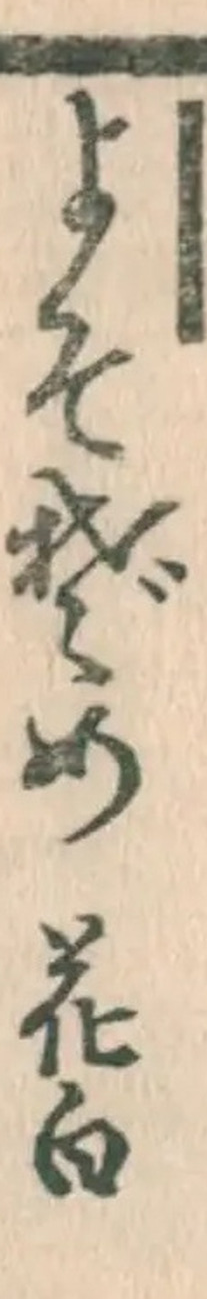よそ我らめ花白
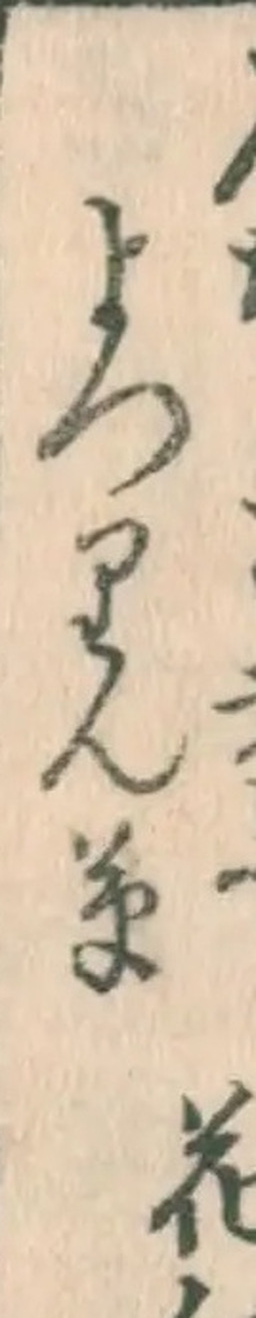よつりん草
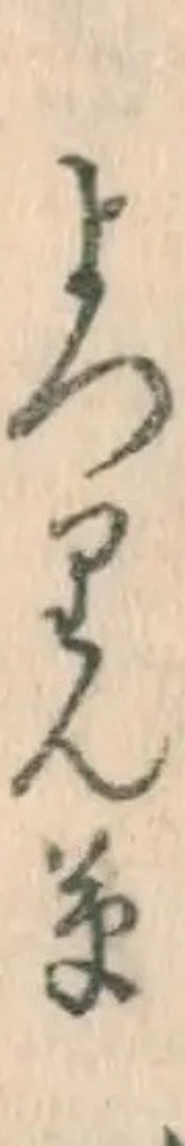よつりん草
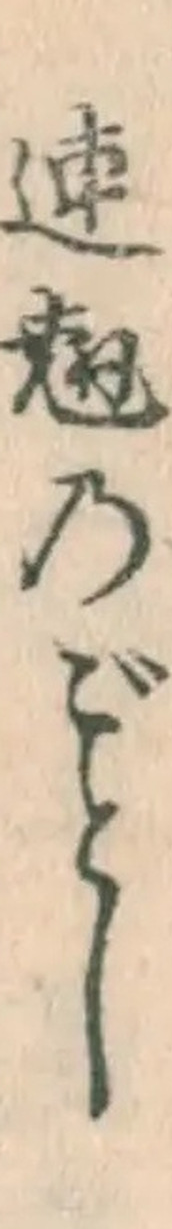連のごとし
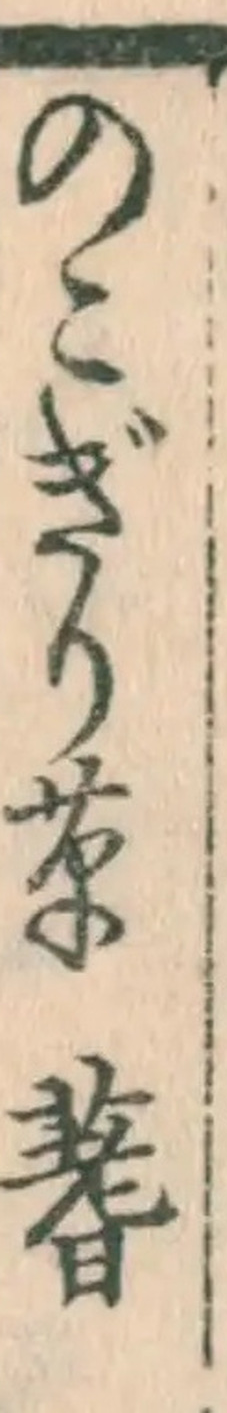のこぎり菜蓍
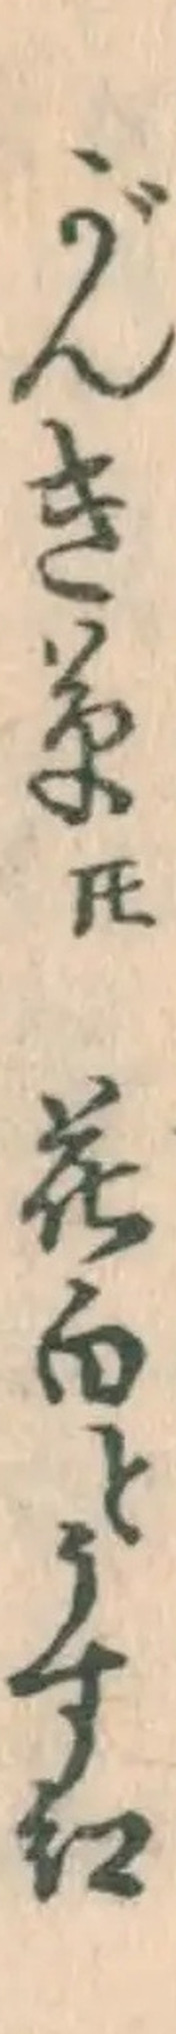がんき草とも花白とうす紅
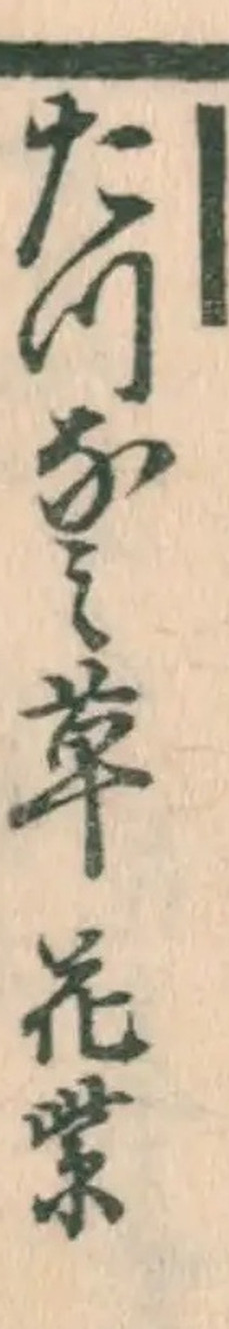たつなみ草花紫
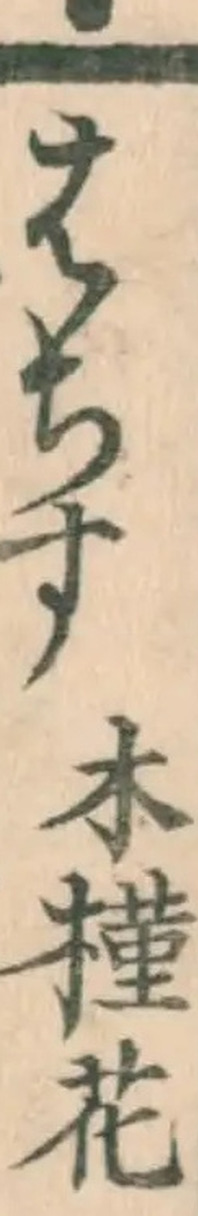はちす木槿花
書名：茶席挿花集
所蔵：国立国会図書館 National Diet Library, JAPAN
